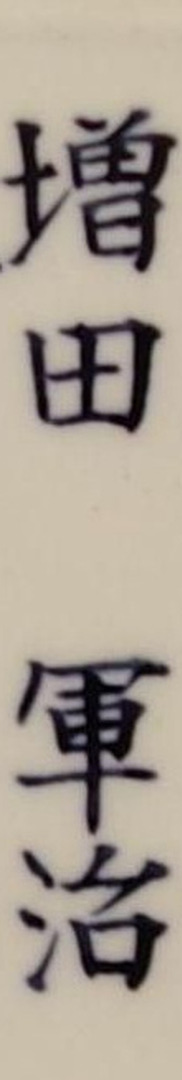増田軍治
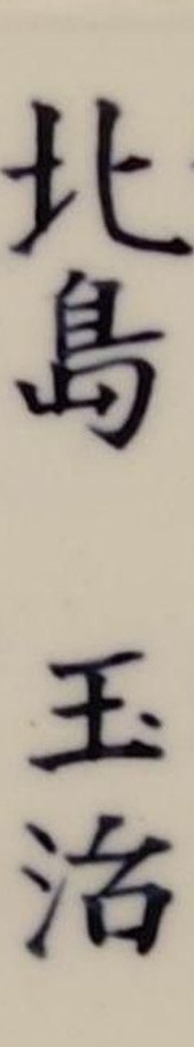北島玉治
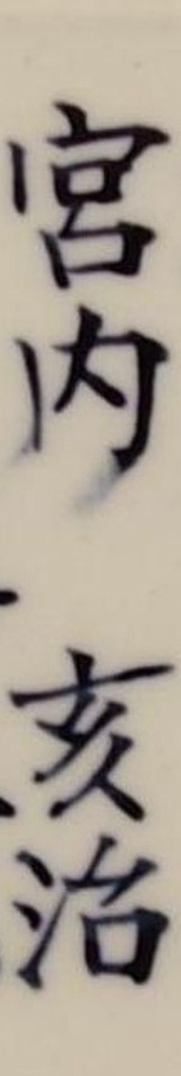宮内亥治
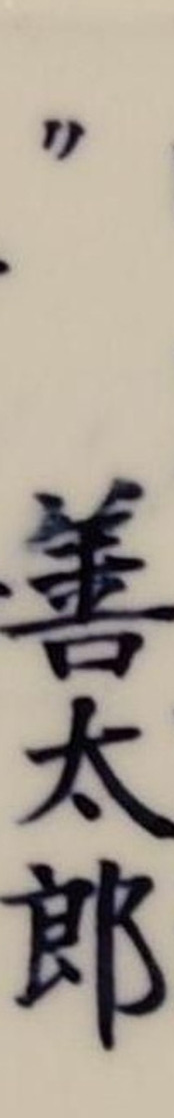善太郎
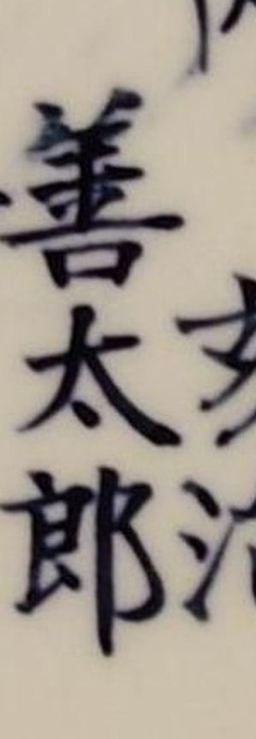善太郎
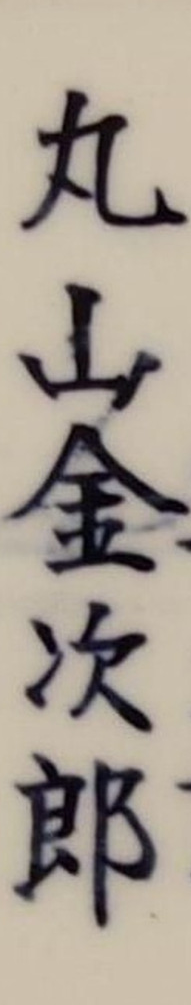丸山金次郎
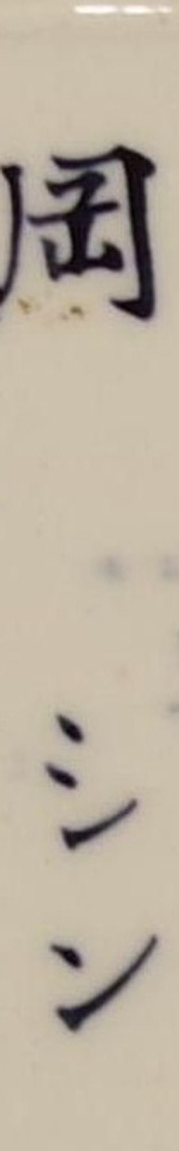岡シン
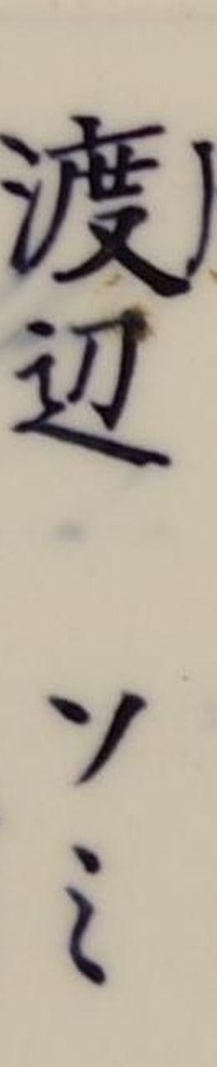渡辺ソミ
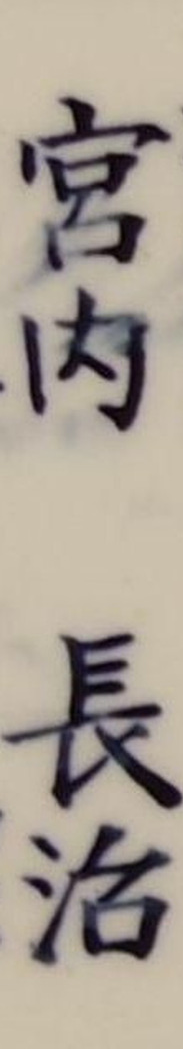宮内長治
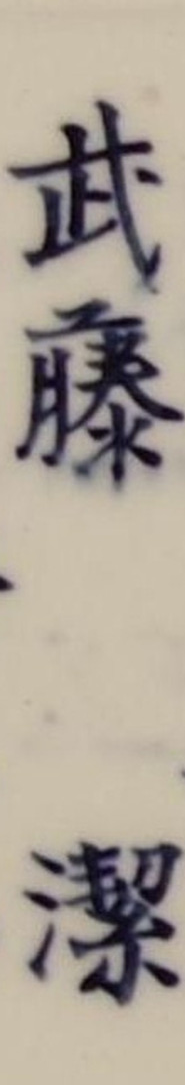武藤潔
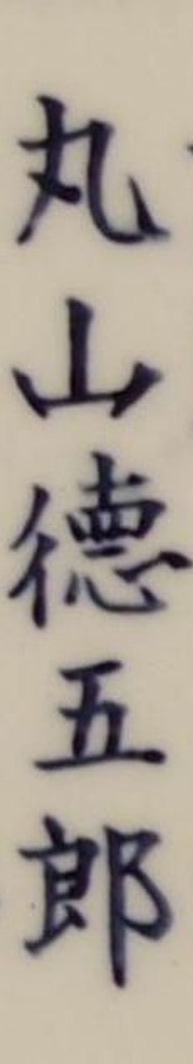丸山徳五郎
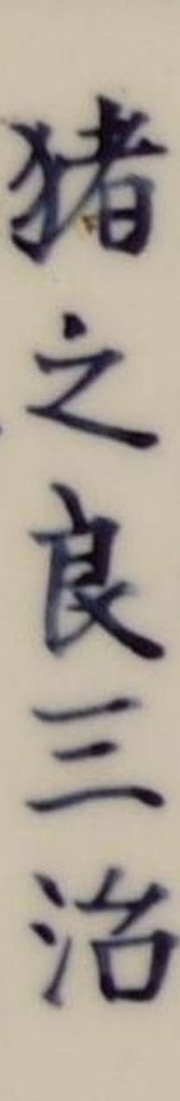猪之良三治
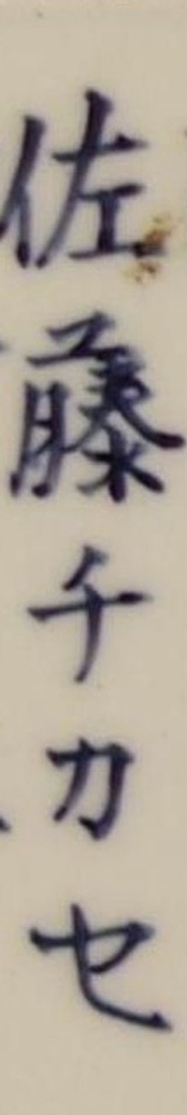佐藤チカセ
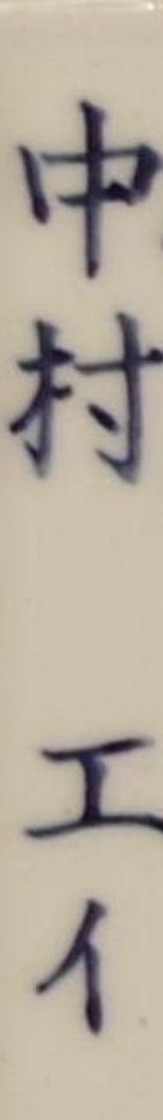中村エイ

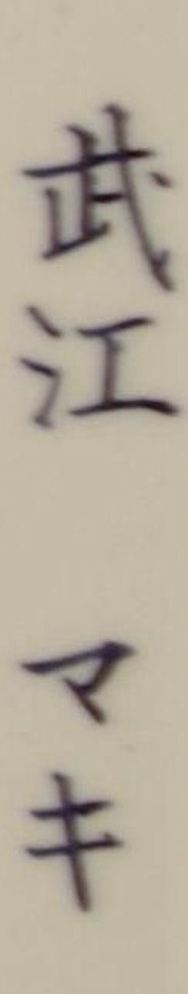武江マキ
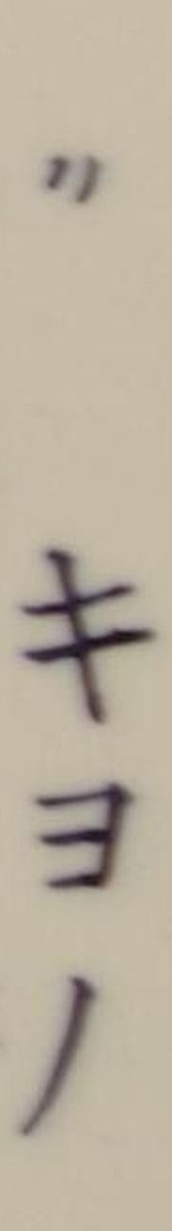キヨノ
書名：E~L
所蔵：高野山金剛峯寺
